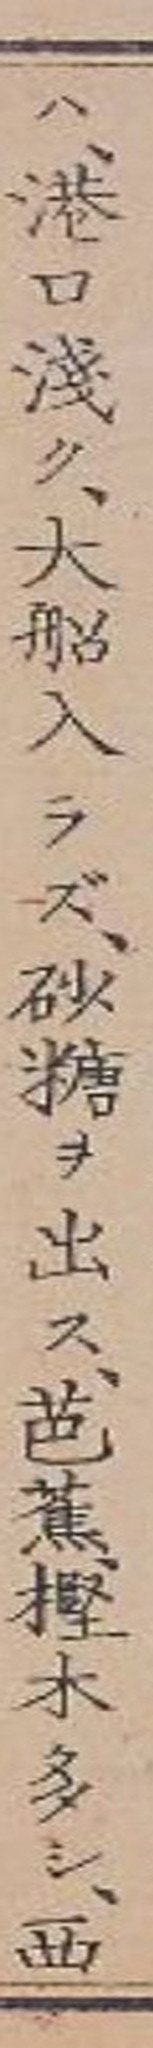ハ、港口浅ク、大船入ラズ、砂糖ヲ出ス、芭蕉、樫木多シ、西
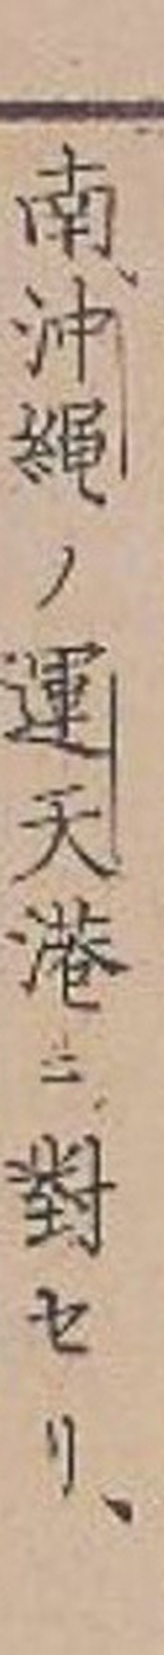南、沖縄ノ運天港ニ対セリ、
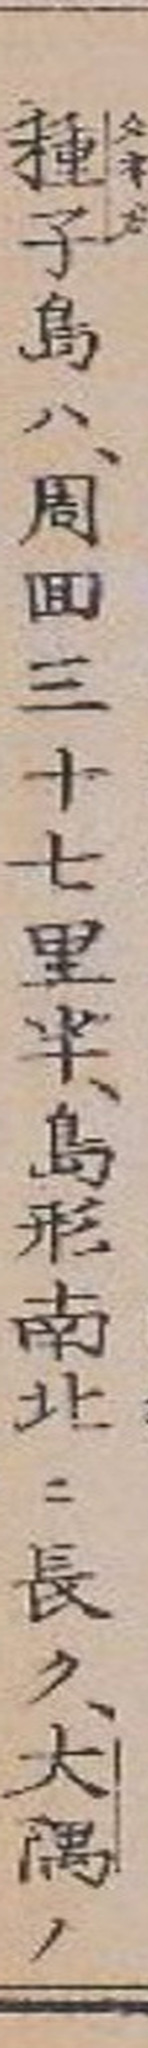種子島ハ、周回三十七里半、島形南北ニ長ク、大隅ノ
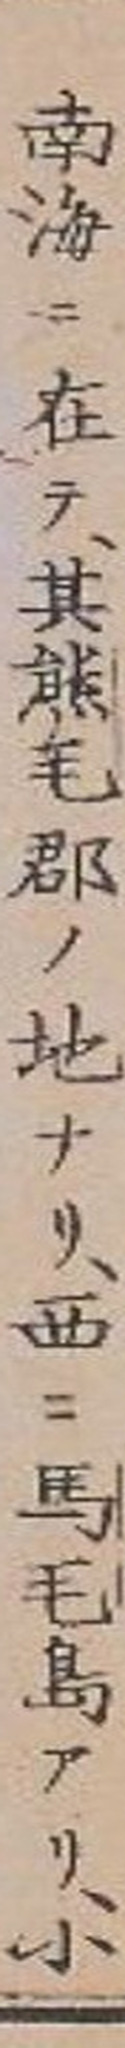南海ニ在テ、其熊毛郡ノ地ナリ、西ニ馬毛島アリ、小
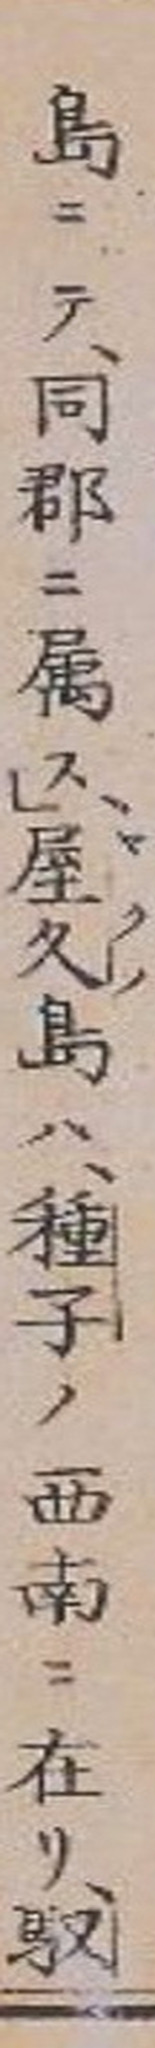島ニテ、同郡ニ属ス、」屋久島ハ、種子ノ西南ニ在リ、馭
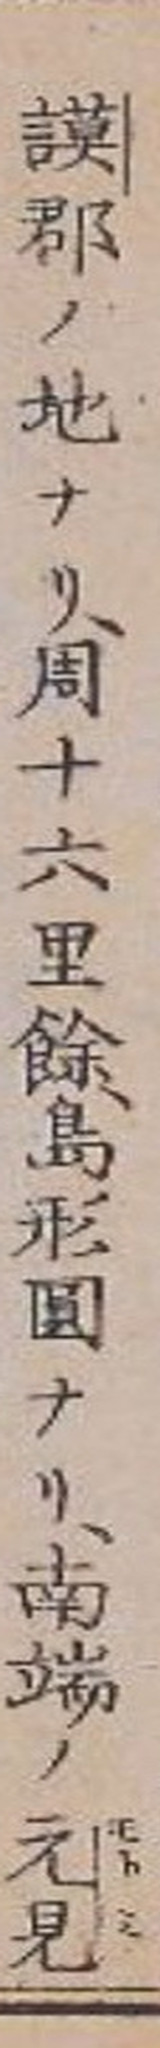謨郡ノ地ナリ、周十六里余、島形円ナリ、南端ノ元見
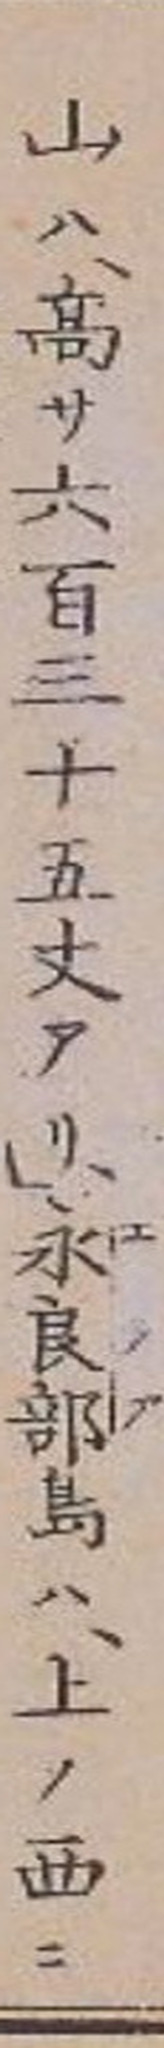山ハ、高サ六百三十五丈アリ、」永良部島ハ、上ノ西ニ
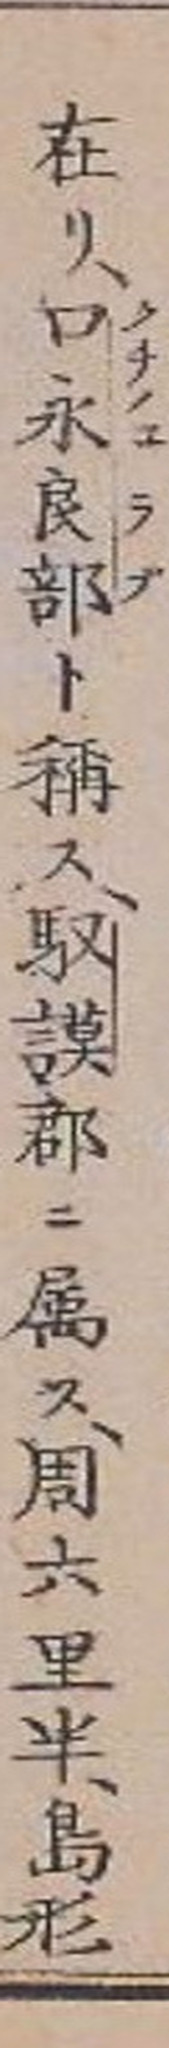在リ、口永良部ト称ス、馭謨郡ニ属ス、周六里半、島形
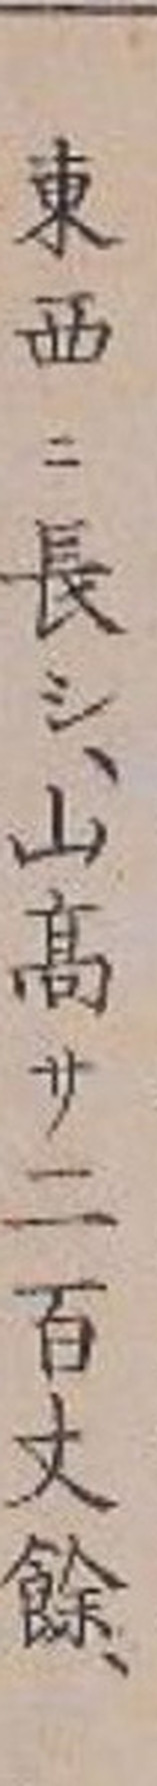東西ニ長シ、山高サ二百丈余、
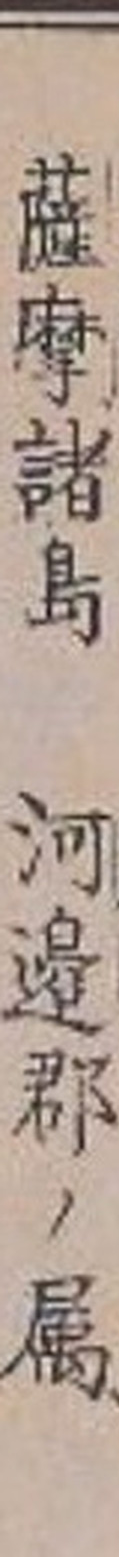薩摩諸島河辺郡ノ属、
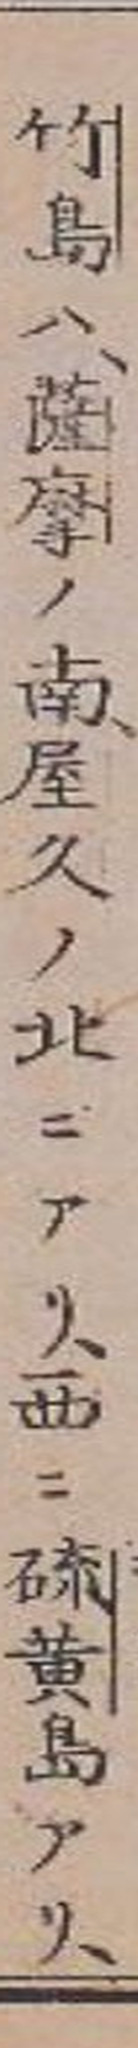竹島ハ、薩摩ノ南、屋久ノ北ニアリ、西ニ硫黄島アリ、
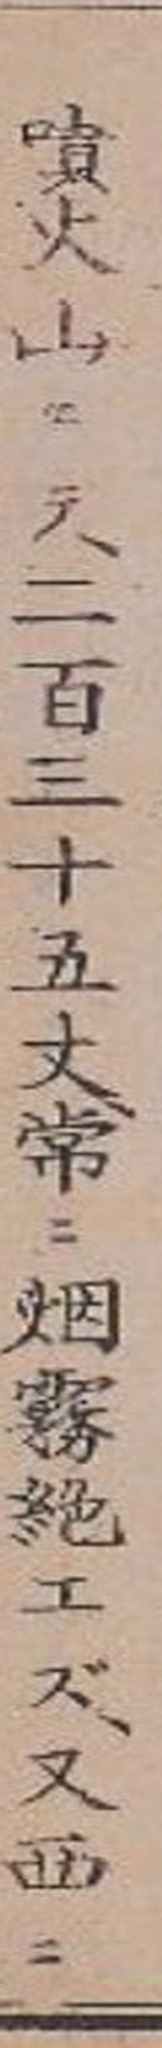噴火山ニテ、二百三十五丈、常ニ煙霧絶エズ、又西ニ

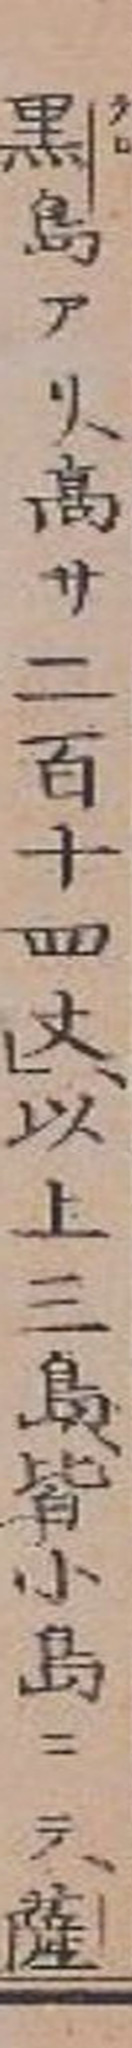黒島アリ、高サ二百十四丈、」以上三島、皆小島ニテ、薩
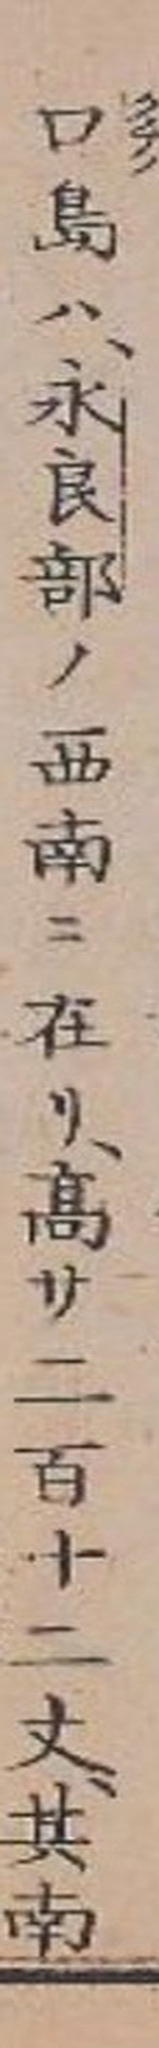口島ハ、永良部ノ西南ニ在リ、高サ二百十二丈、其南
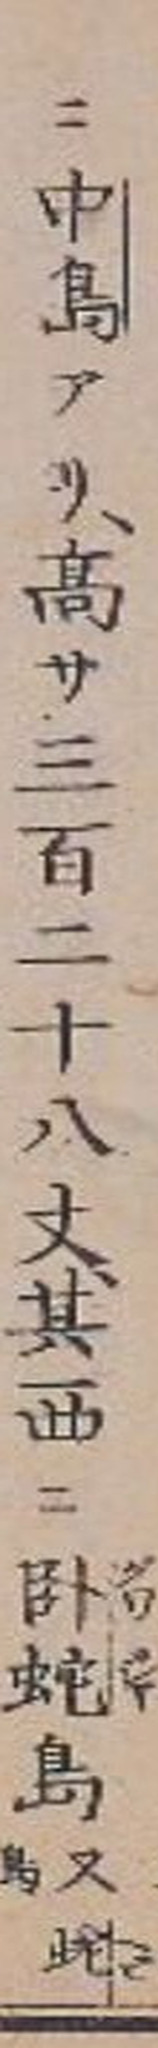ニ中島アリ、高サ三百二十八丈、其西ニ卧蛇島又蛇島
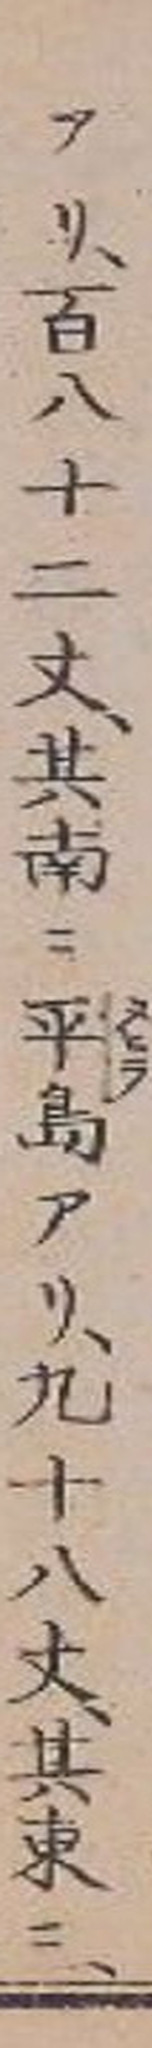アリ、百八十二丈、其南ニ平島アリ、九十八丈、其東ニ、
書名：琉球新誌 巻上
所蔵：University of the Ryukyus Library
